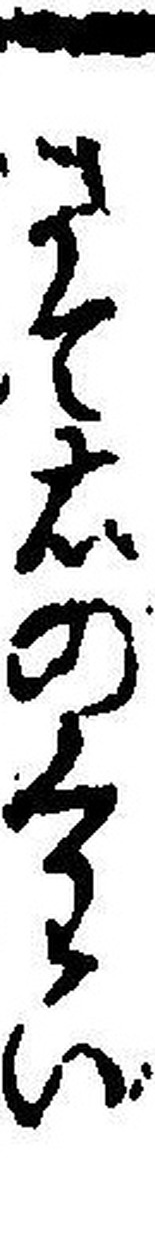さて右のくわい
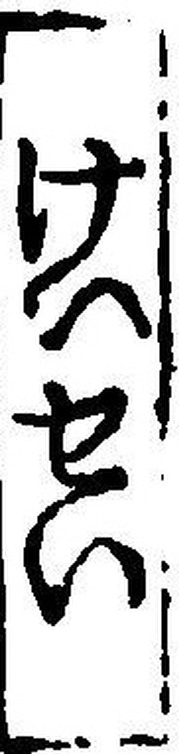けいせい
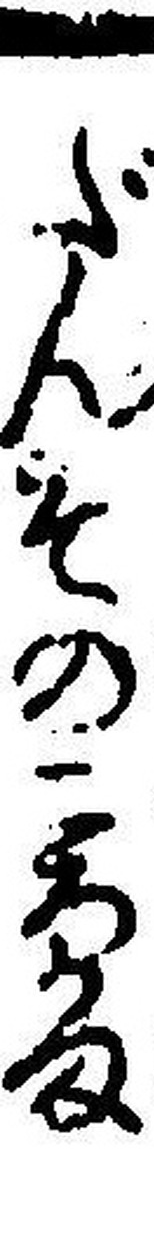だんそのころかま
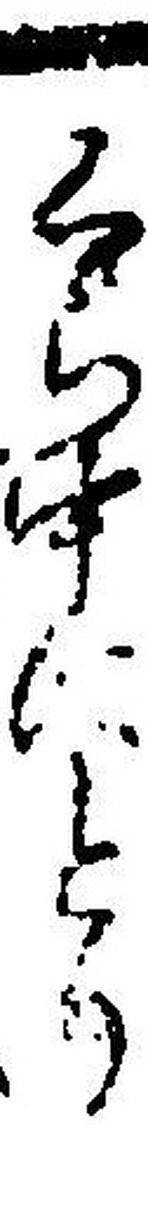くら中にとり
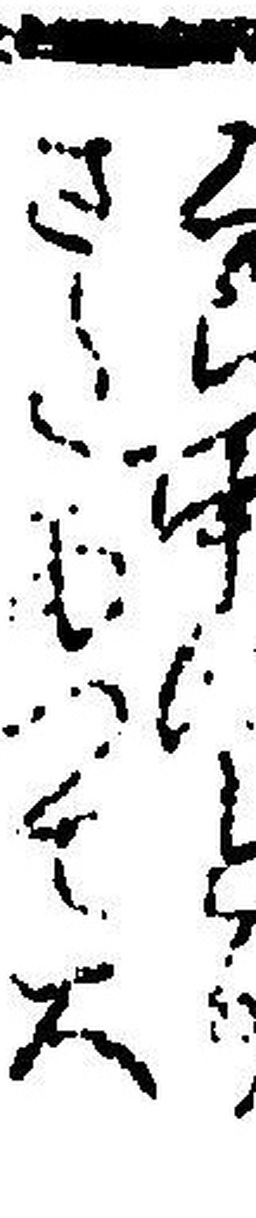さたあつて大
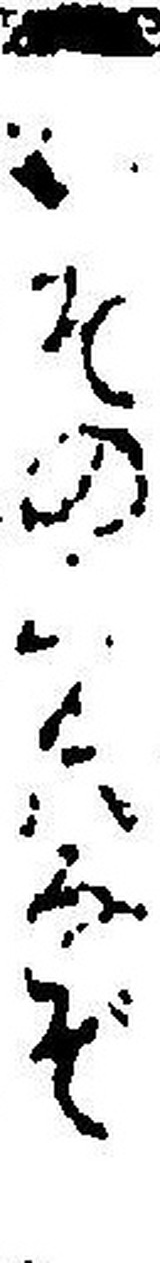そのくるはなぞ
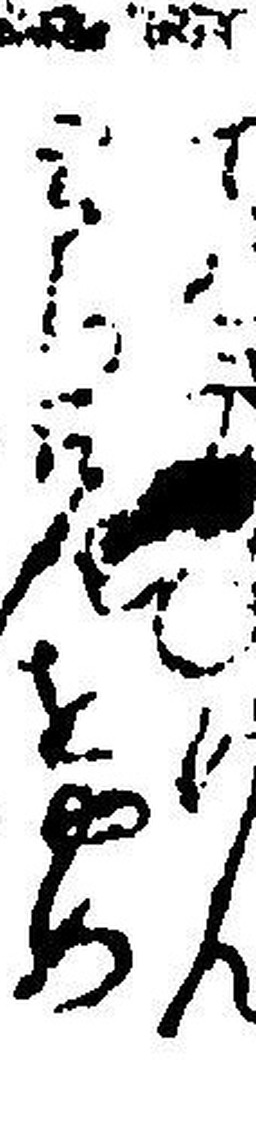みちけんをやめ
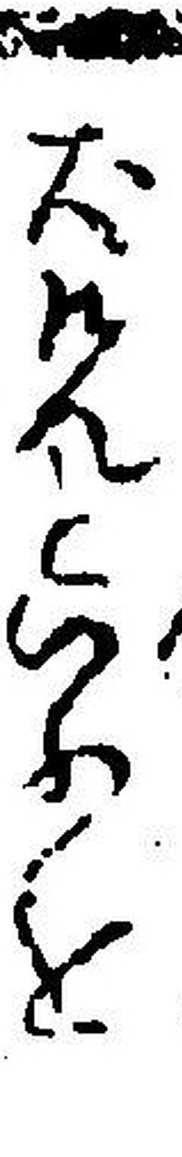犬けんといふを
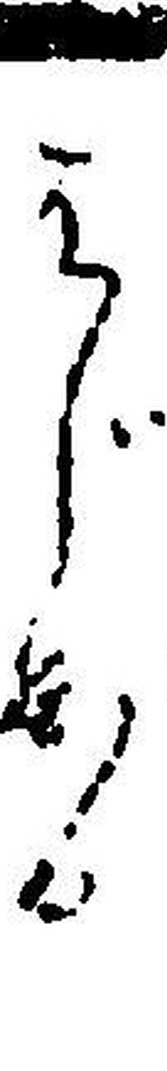はじめる
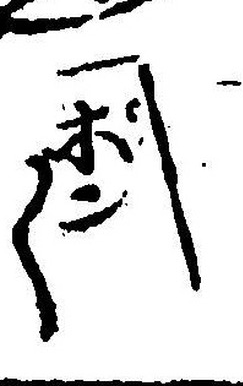〽ポン
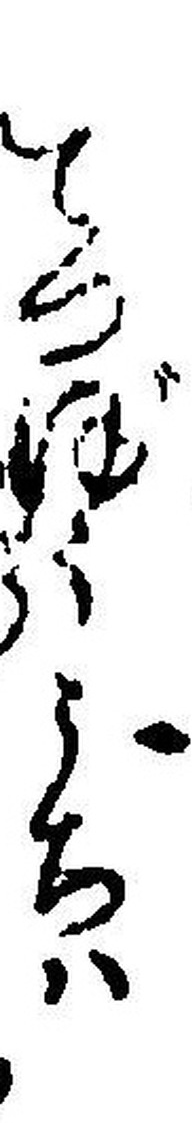てつぽううちは
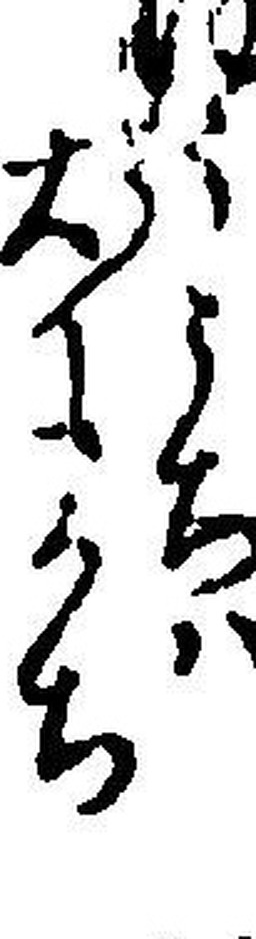犬にかち
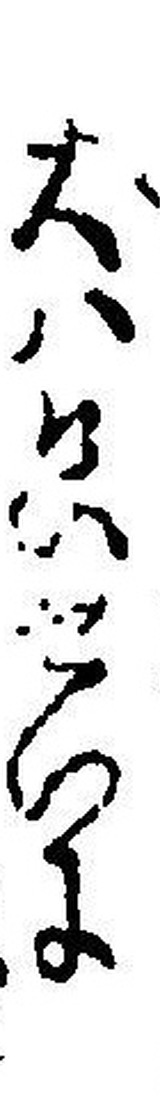犬はけいせいに
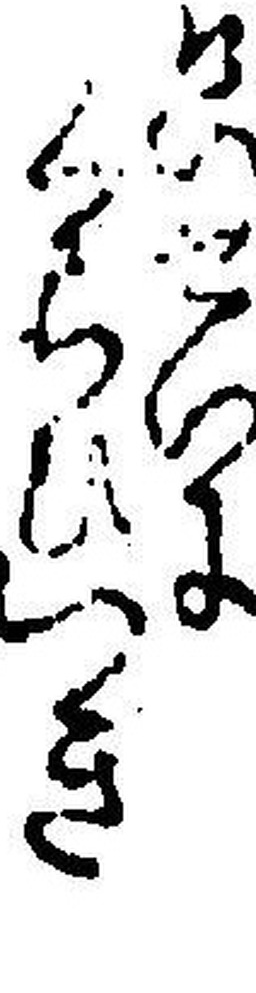くらひつき
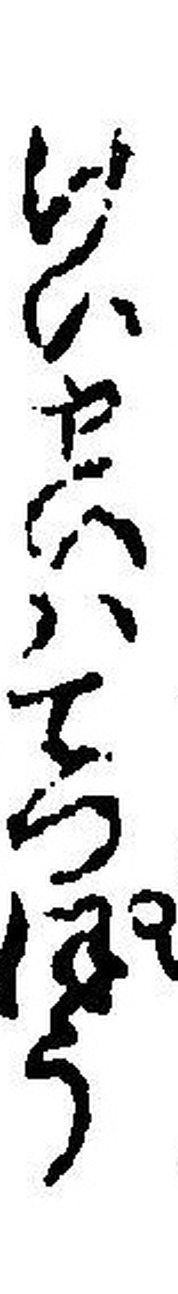けいせいはてつぽう
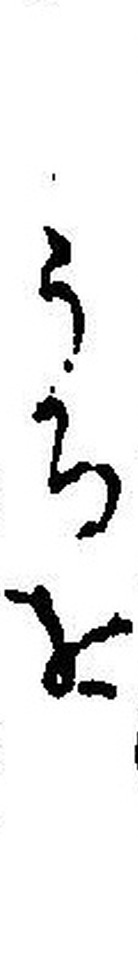うちを
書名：花芳野犬斑 / 山東京伝作
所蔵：東京大学総合図書館 General Library in the University of Tokyo, JAPAN
